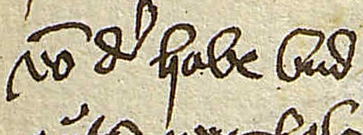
vo* d* habe vnd
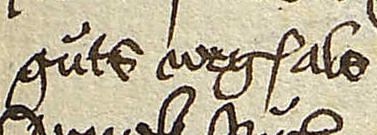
güts weg* als
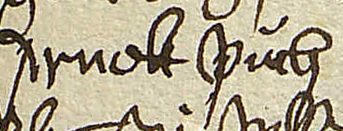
Arnolt Püch
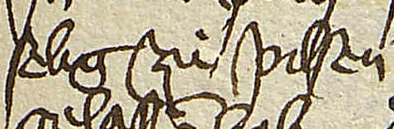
ſelig cʒü Pilſen
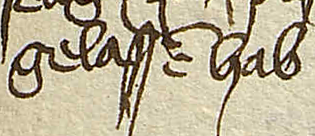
gelaſſe* hab
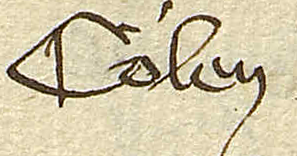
Cölen
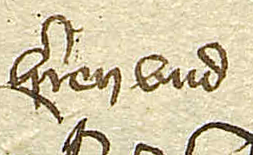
h*ren vnd
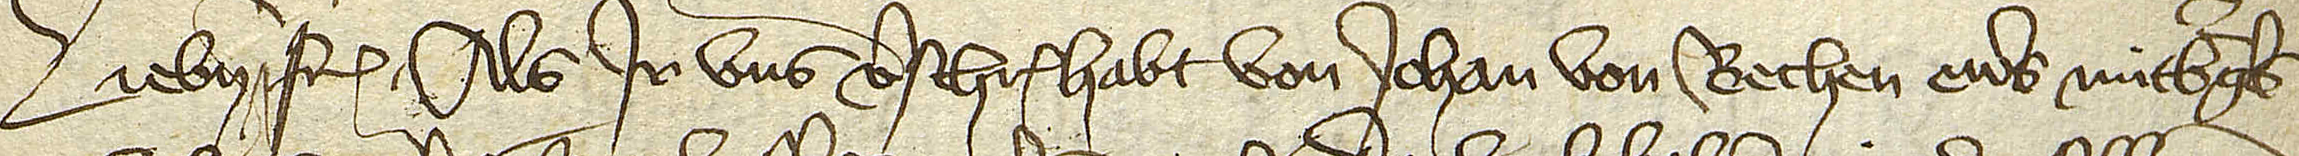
Liebn* fr* / Als Ir vns v*ſchr* habt von Iohan von Bechen ew*s mitb*g*s
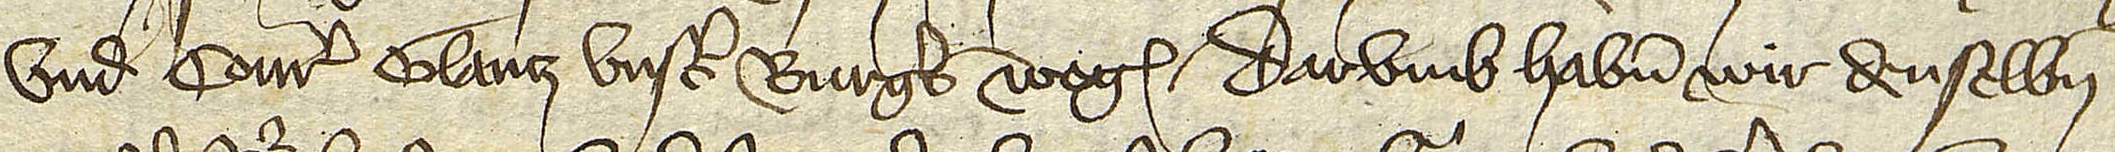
vnd Conr* Glancʒ vnſ*s Burg*s weg* / Darvmb habn* wir denſelbn*
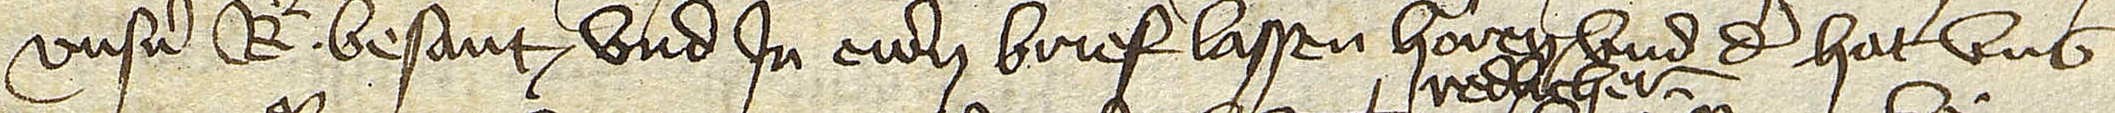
vnſn* B*. beſant / vnd In ew*n brief laſſen hören / vnd d* hat vns
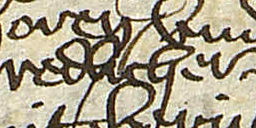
redlicher
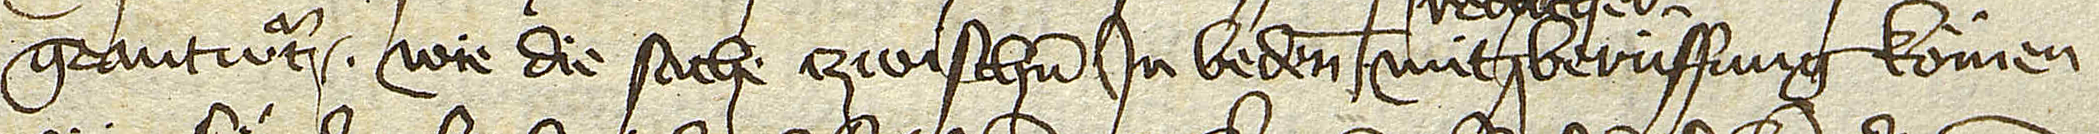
geantwt* / . wie die ſache cʒwiſchn* In beden mit berüffung kömen
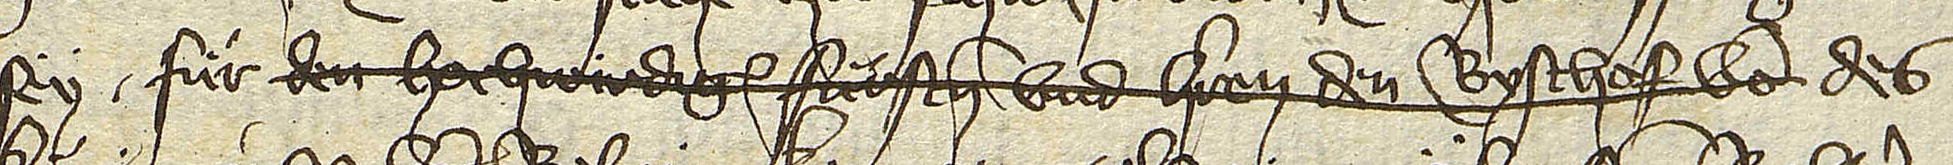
ſey / für den hochwirdig* fürſtn* vnd h*ren den Byſchof vo* des
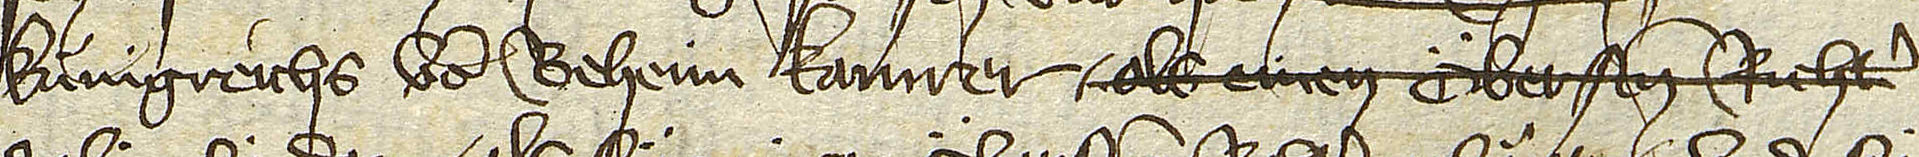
Künigreichs vo* Beheim Kamrer / als einen Öberſtn* Richt*
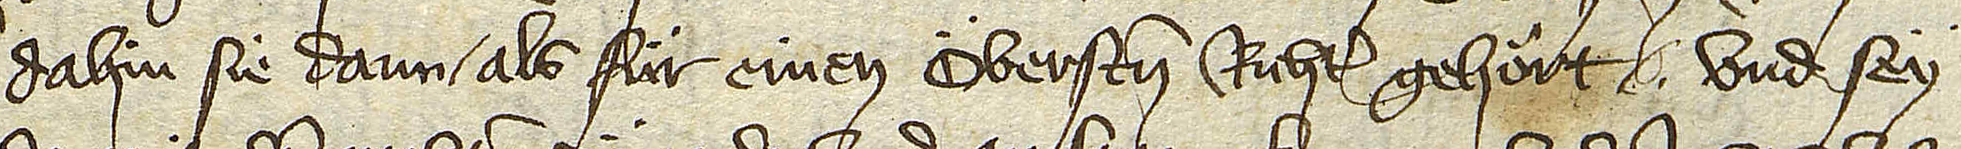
dahin ſie dann / als für einen Öberſtn* Riht* gehört / vnd ſey
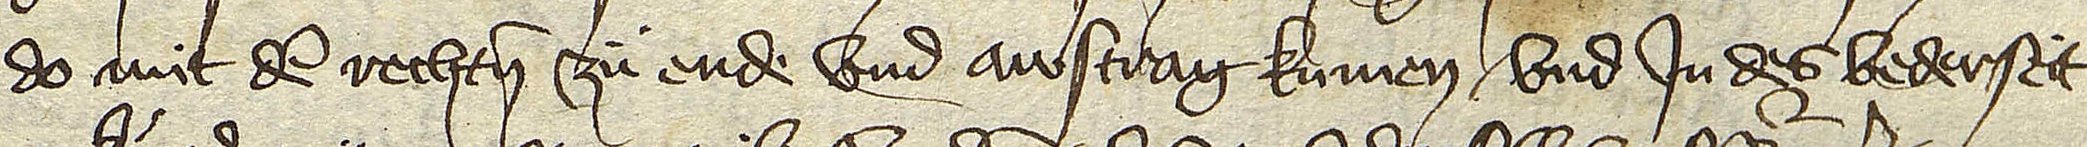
do mit d* rechtn* cʒü ende vnd awſtrag kumen / vnd In des bederſeit
